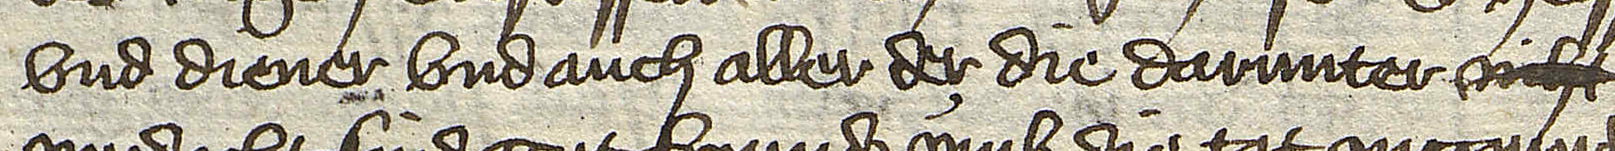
vnd diener vnd auch aller der die darunter niht
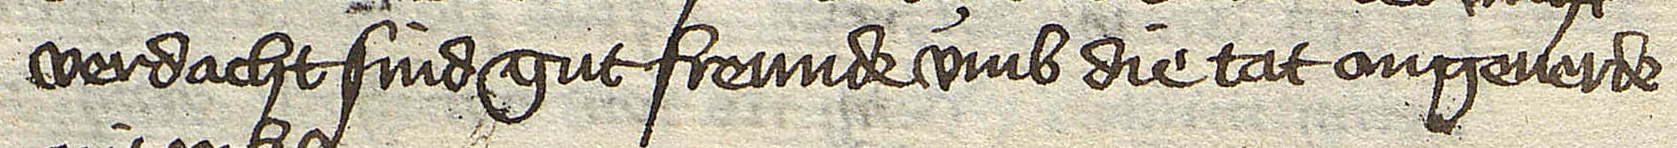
verdacht ſind gut freunde v̈mb die tat ongeuerde
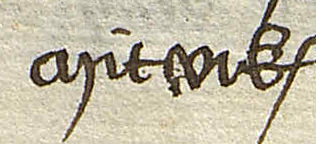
Mit vrk*
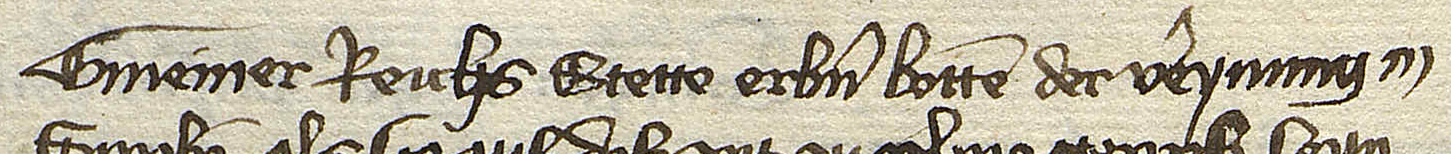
Gmeiner Reichs Stette erbn* botte* der v*eynung in
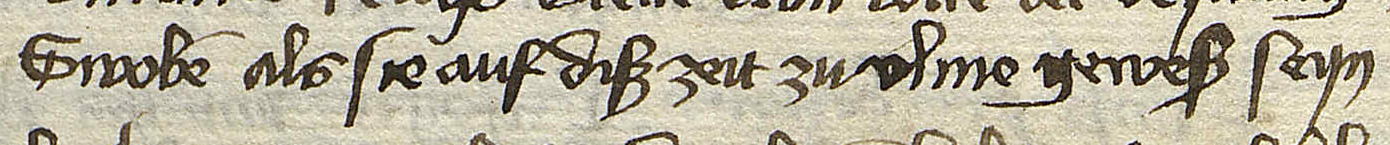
Swobe* als ſie auf diſʒ ʒeit ʒu vlme geweſ* ſeyn
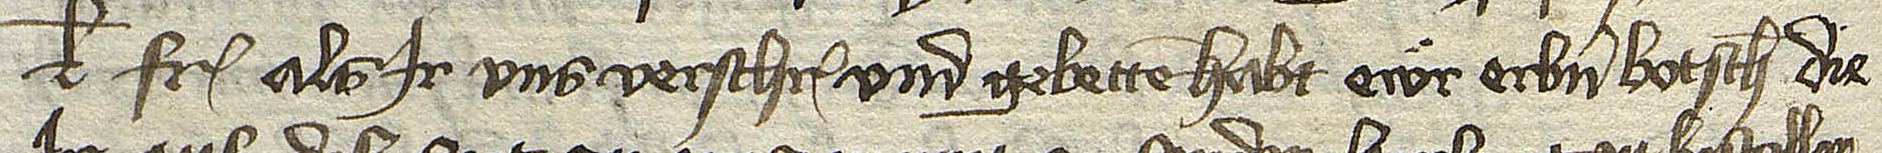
L* fr* als Ir vns verſchr* vnd gebette* habt eẅr erbn* botſch* die
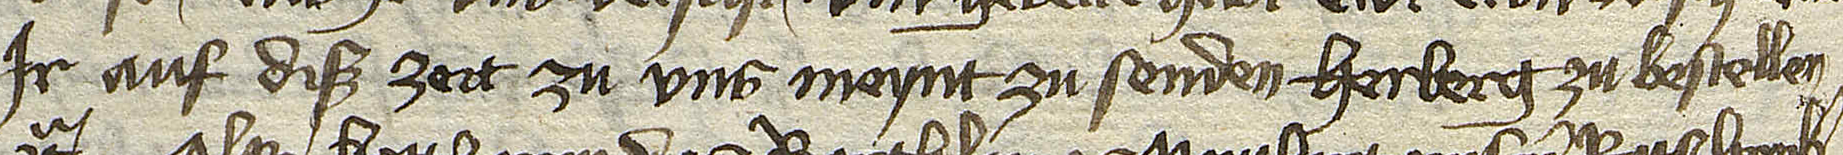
Ir auf diſʒ ʒeit ʒu vns meynt ʒu ſenden herberg ʒu beſtellen
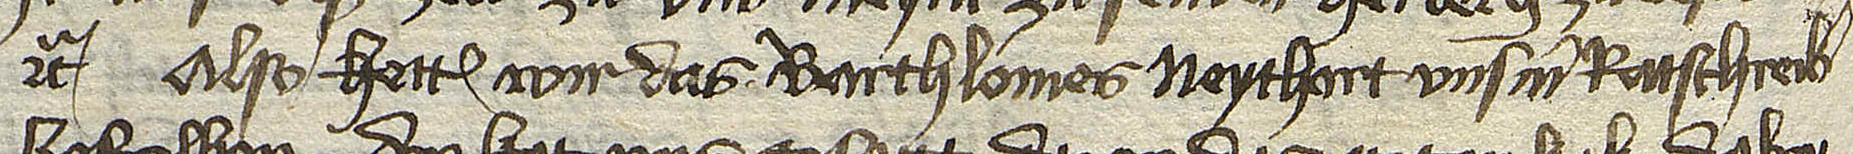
ec* Alſo hett* wir das Barthlomes Neythart vnſm* Ratſchreib*
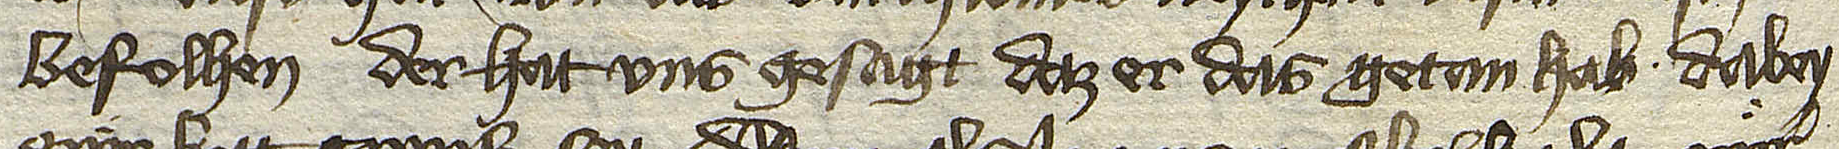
befolhen der hat vns geſagt daʒ er das getan hab . dabey
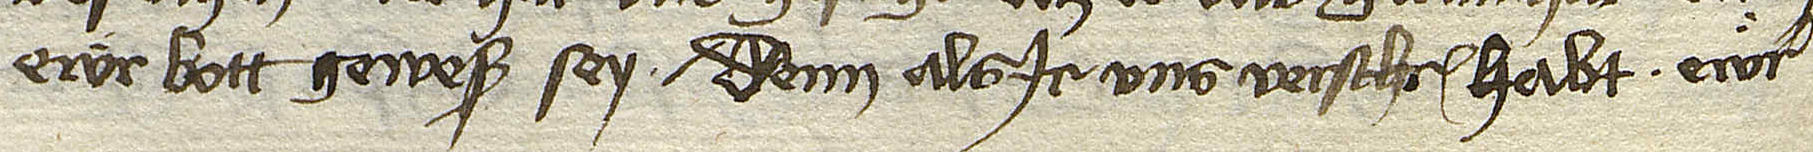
eẅr bott geweſ* ſey / Denn als Ir vns verſchr* habt eẅr*
